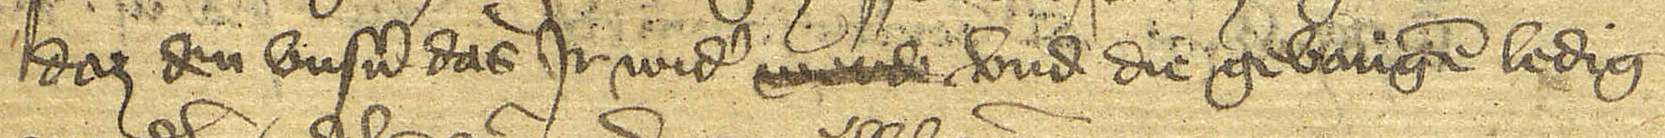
daʒ den vnſn* das Ir wid* werde / vnd die gevange* ledig
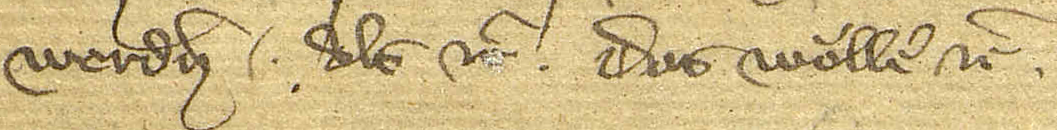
werdn* / Als ec* . Das wölle* ec* .
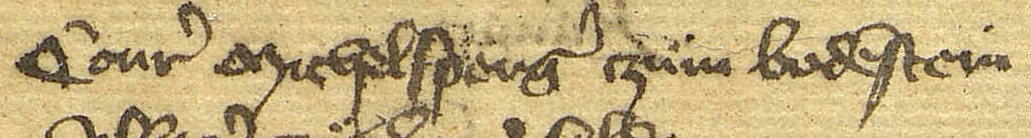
Conr* Michelſperg* cʒüm bode*ſtein
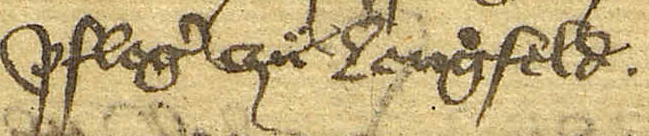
Pfleg* cʒü Lengfeld .
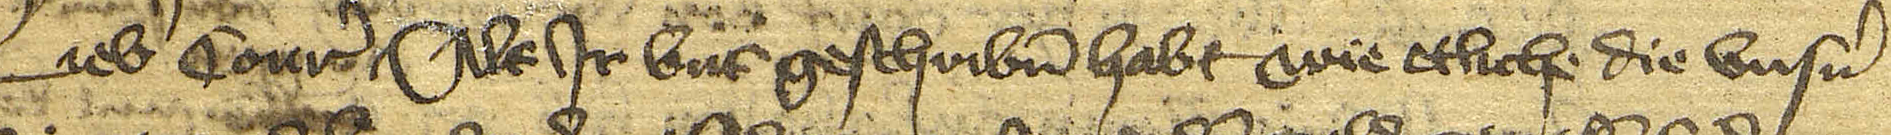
Lieb* Conr* / Als Ir vns geſchribn* habt wie etliche die vnſn*
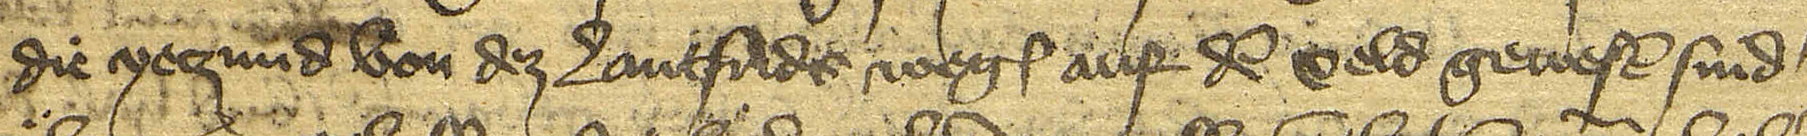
die yecʒund von deʒ Lantfrids weg* auf de* veld geweſe* ſind
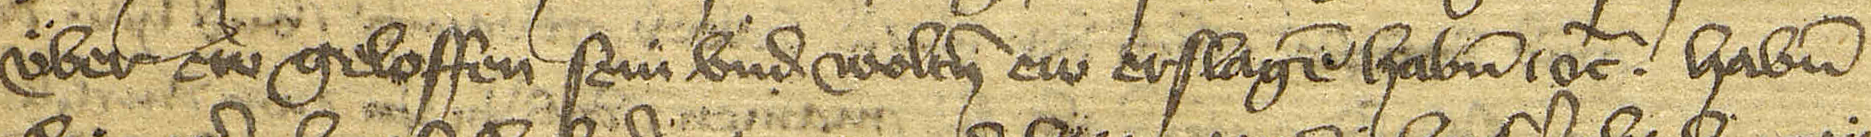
v̈ber ew geloffen ſein vnd woltn* ew erſlage* habn* / ec* . habn*
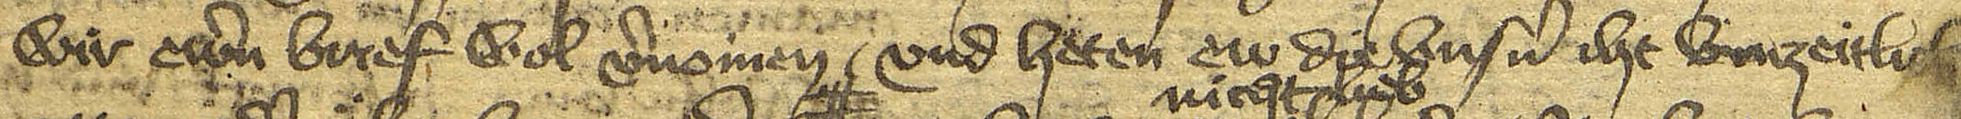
wir ew*n brief wol v*nomen / vnd heten ew die vnſn* iht vmʒeitlich*
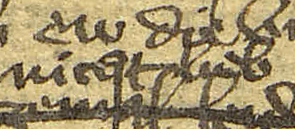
nicht lieb
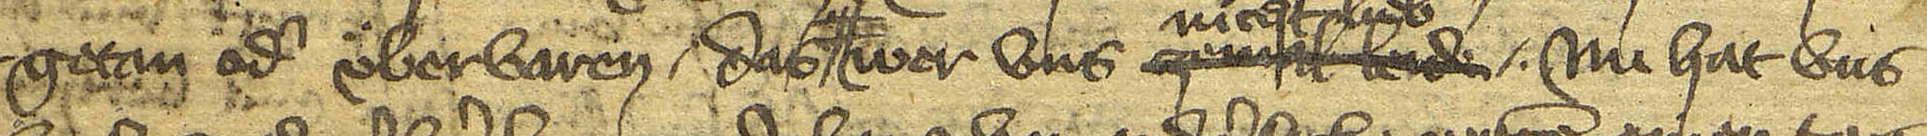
getan od* v̈bervaren / Das wer vns ʒemal leide / . Nu hat vns
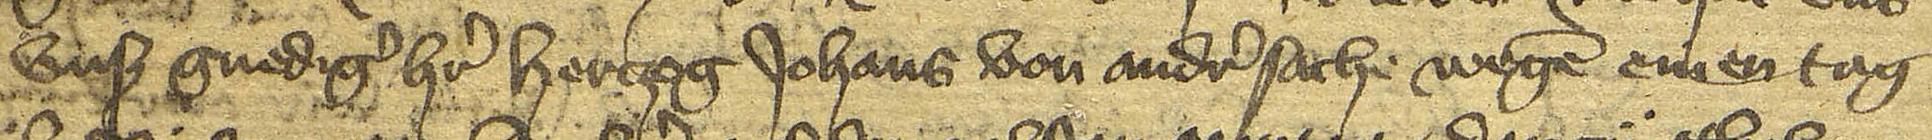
vnſ* gnedig* hr* hercʒog Iohans von andr* ſache wege* einen tag
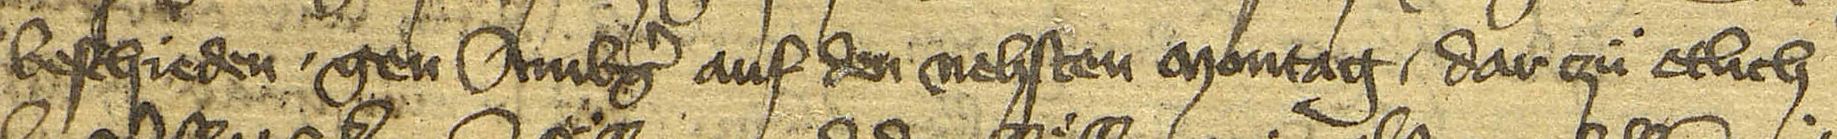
beſchieden / gen Ambg* auf den nehſten Montag / dar cʒü etlich
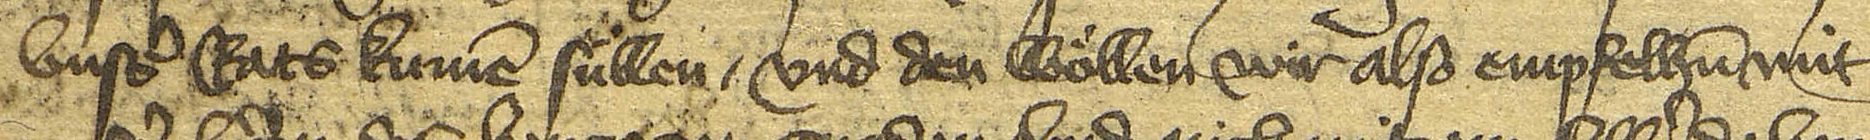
vnſs* Rats kume* ſüllen / vnd den wöllen wir alſo empfelhn* mit
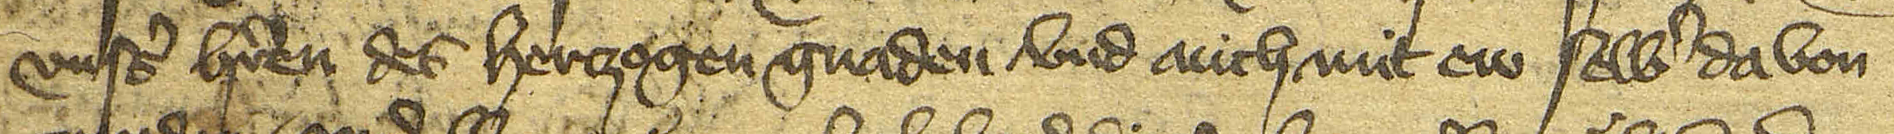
vnſs* hr*en des hercʒogen gnaden / vnd auch mit ew ſelb* davon
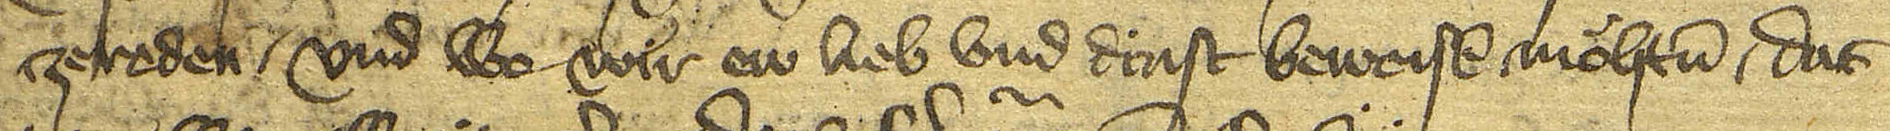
cʒereden / vnd wo wir ew lieb vnd dinſt beweiſe* möhtn* / das
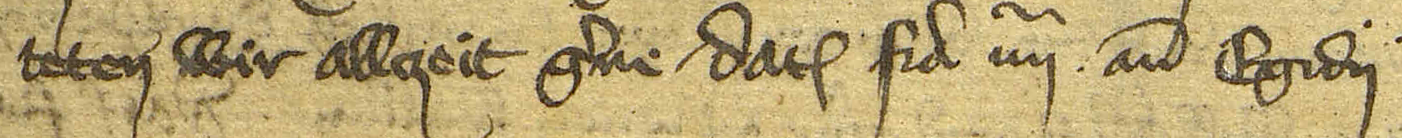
teten wir allcʒeit g*ne / dat* fia* iiii* an* Egidii
